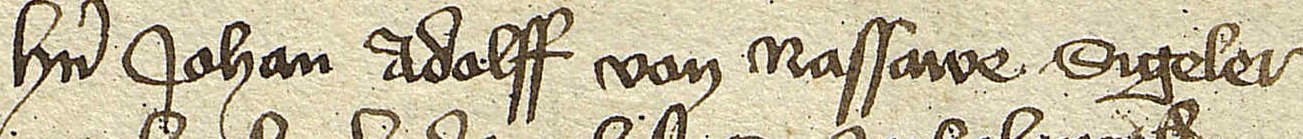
hn* Iohan Adolff von Naſſawe Sigeler
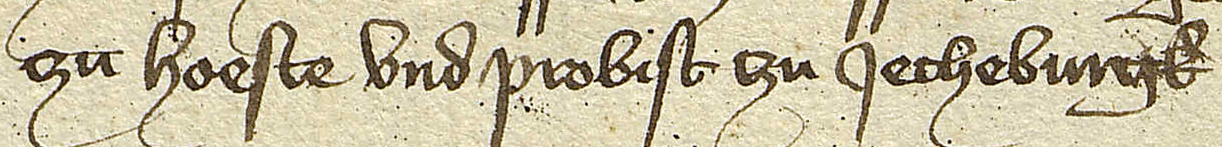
cʒu hoeſte vnd probiſt cʒu Iecheburgk
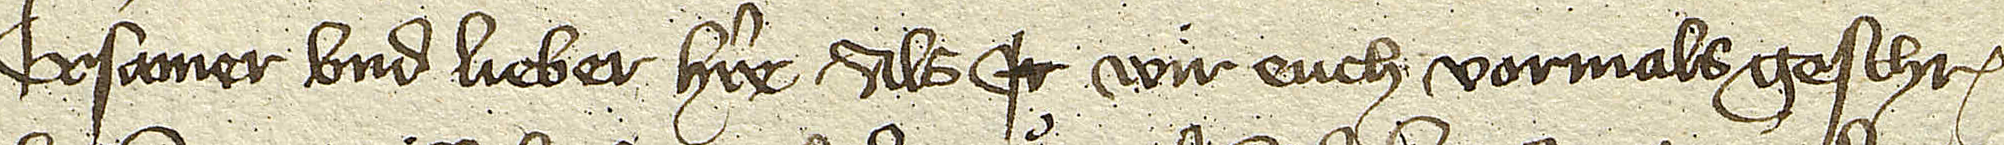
Erſamer vnd lieber h*re / Als Ir wir euch vormals geſchr*
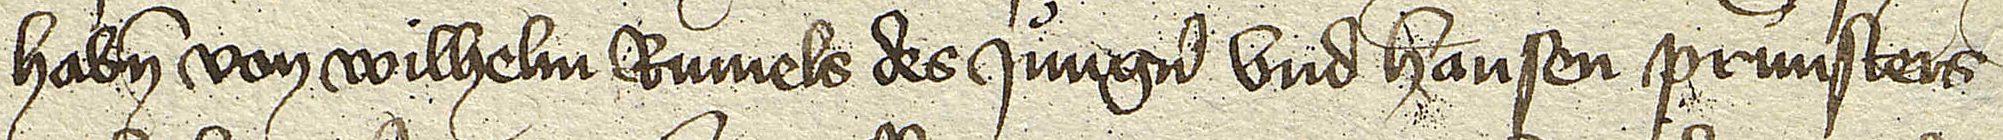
habn* von wilhelm Rumels des Iüngn* vnd Hanſen prünſters
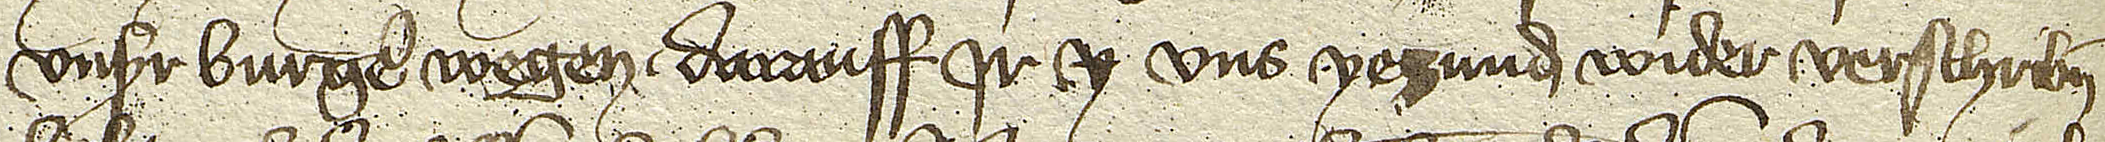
vnſ*r burge* wegen / darauff Ir y vnd yecʒund* wider verſchribn*
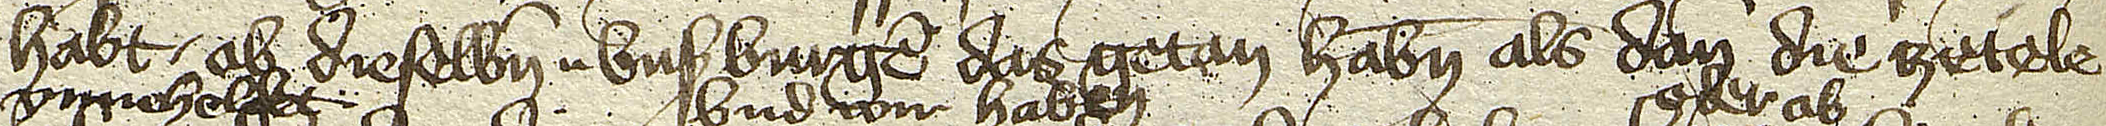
habt / ob dieſelbn* ~ vnſ* burge* das getan habn* als dan* die cʒetele
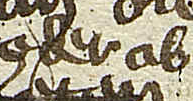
oder ob
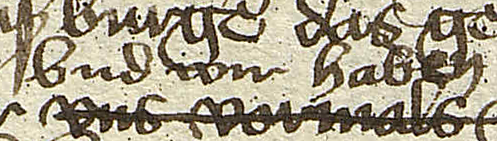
vnd wir haben
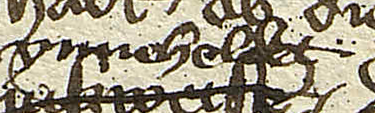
ynnehellet
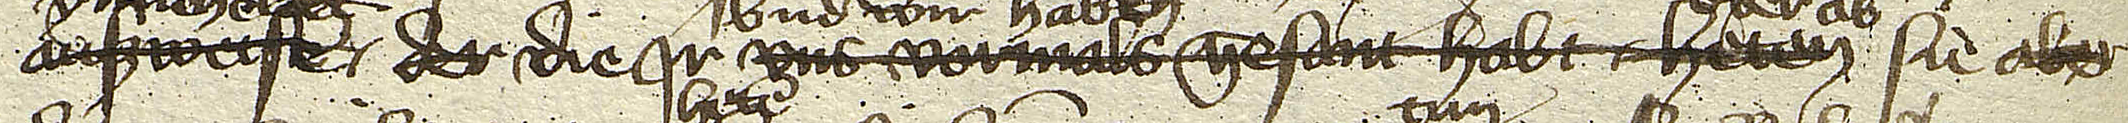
auſʒweiſe* / der / die Ir vns vormals geſant habt / heten ſie aber
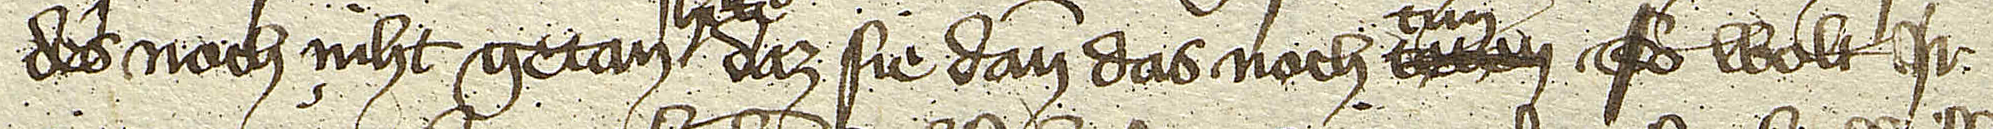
des noch niht getan daʒ ſie dan* das noch teten / ſo wolt Ir
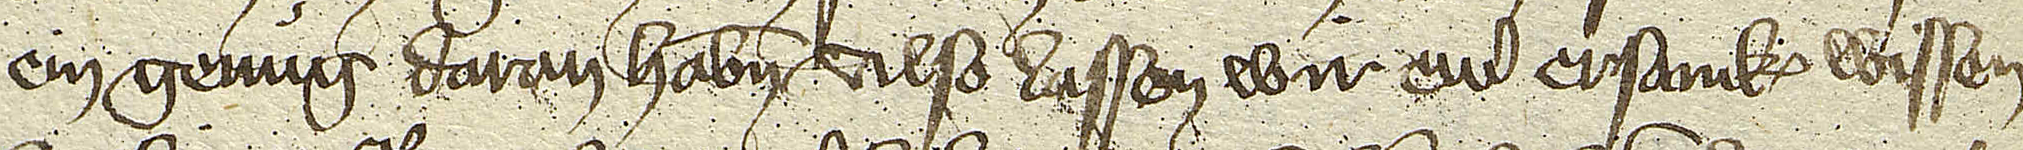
ein genüg daran habn* / Alſo laſſen wir ew* erſamk* wiſſen
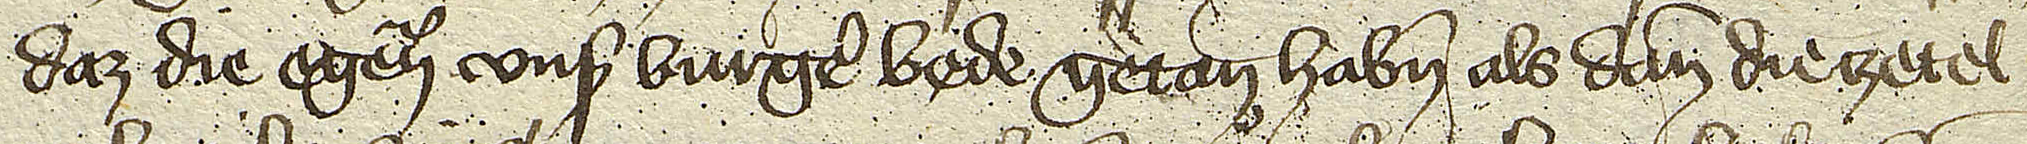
daʒ die egen* vnſ* burge* bede getan habn* als dan* die cʒetel
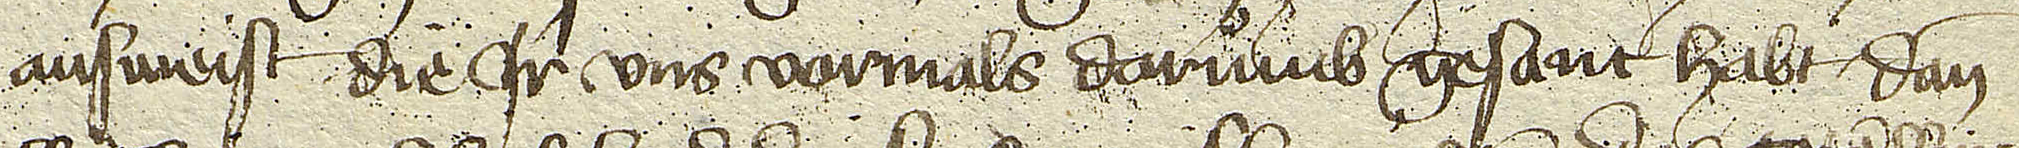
auſweiſt die Ir vns vormals darümb geſant habt / dan*
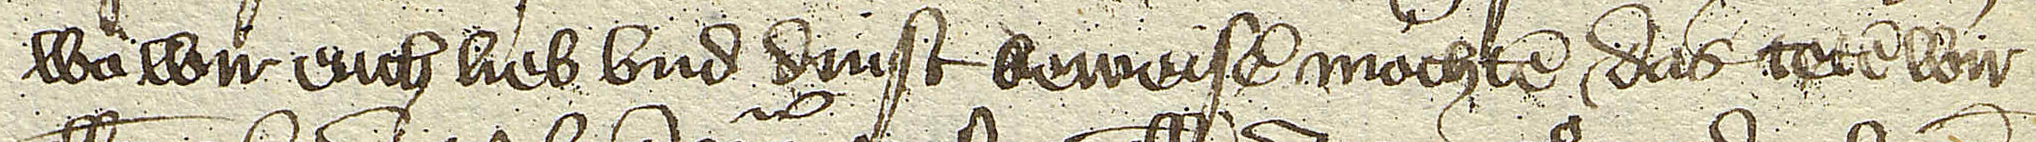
wo wir euch lieb vnd dinſt beweiſe* möchte* / das tete* wir
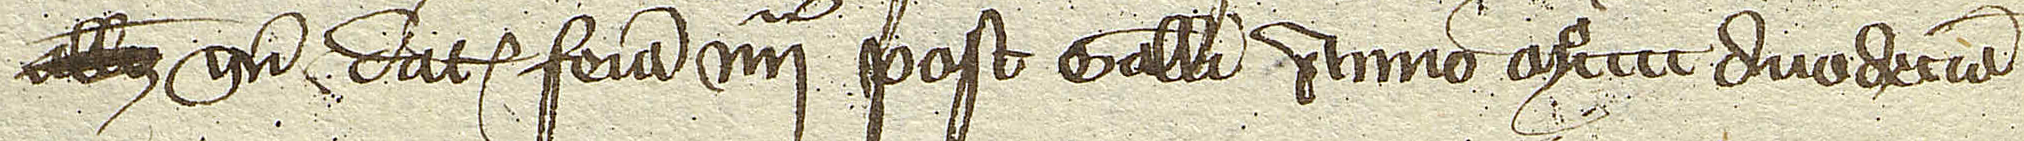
allcʒ* gn* / dat* feia* iiii* poſt Galli Anno Mcccc duodecio*
